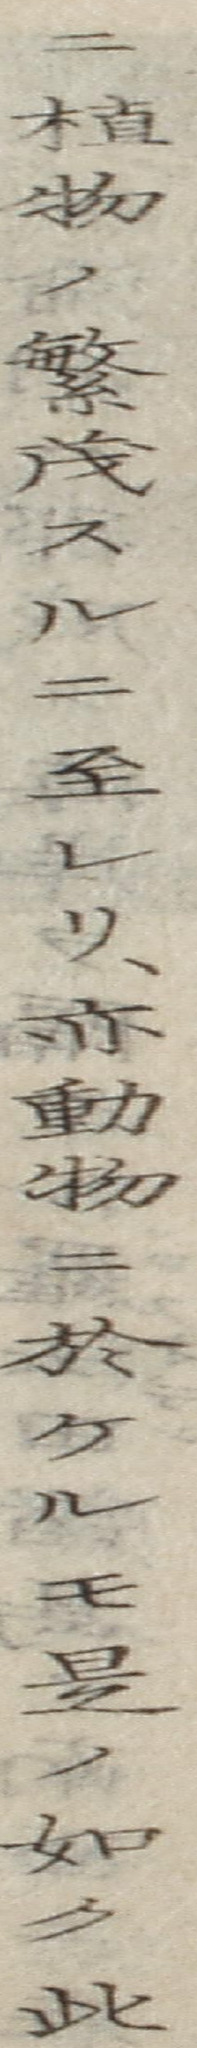ニ植物ノ繁茂スルニ至レリ、亦動物ニ於ケルモ是ノ如ク此
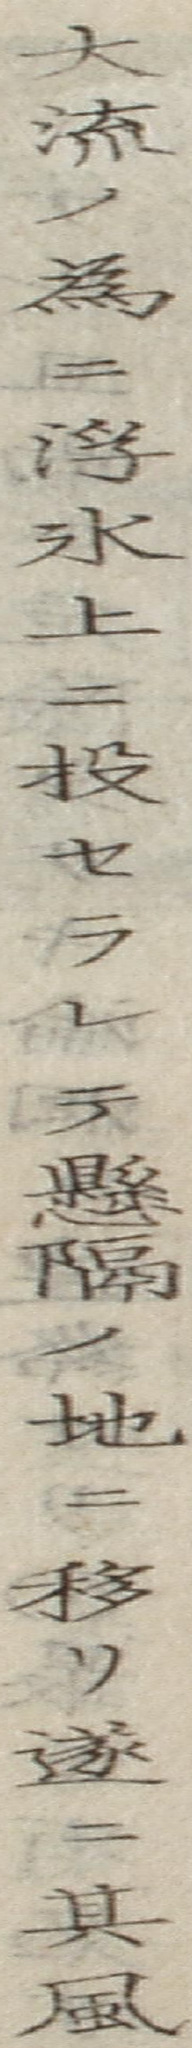大流ノ為ニ浮氷上ニ投セラレテ懸隔ノ地ニ移リ遂ニ其風
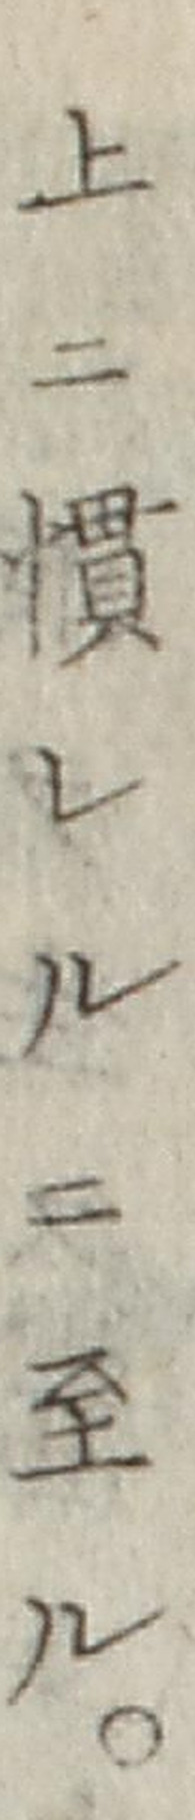上ニ慣レルニ至ル。
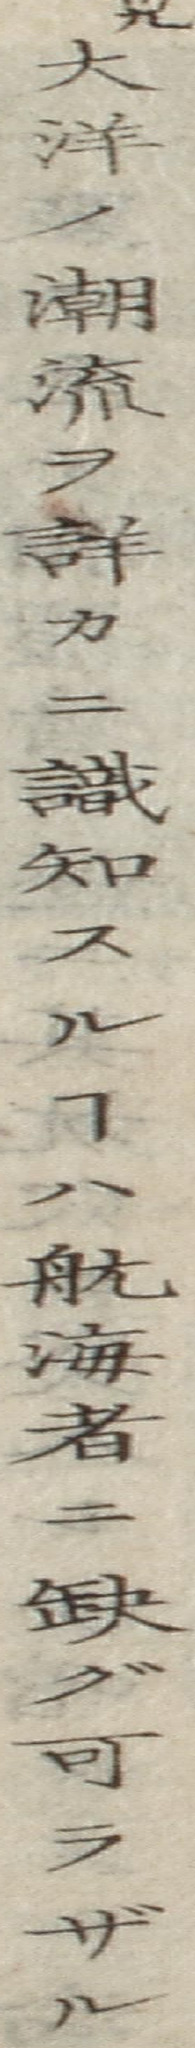卅九大洋ノ潮流ヲ詳カニ識知スルヿハ航海者ニ欫グ可ラザル
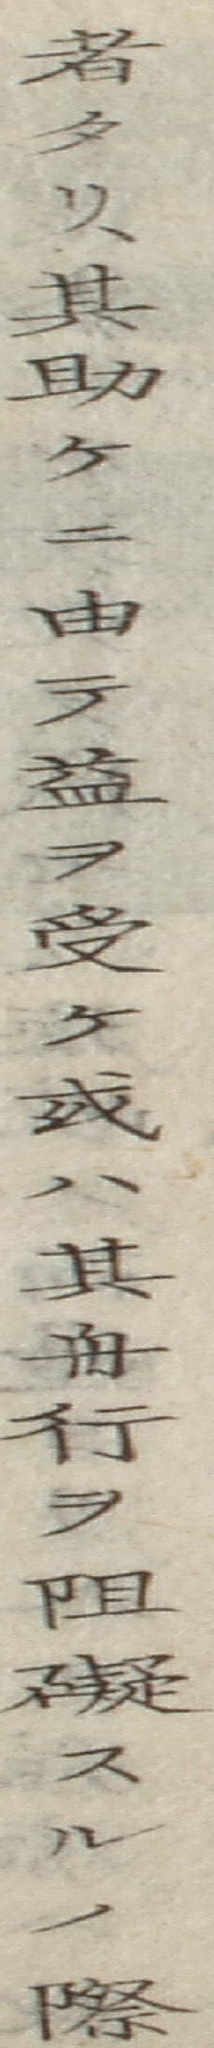者タリ、其助ケニ由テ益ヲ受ケ或ハ其舟行ヲ阻礙スルノ際
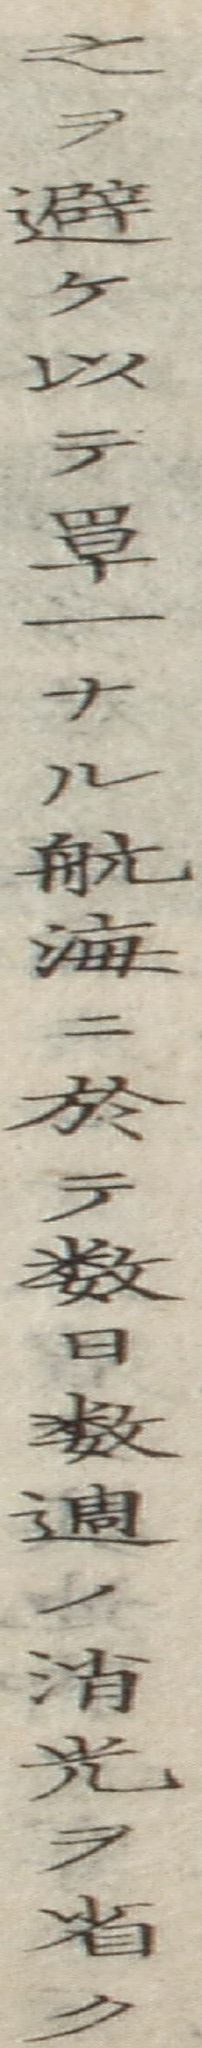之ヲ避ケ以テ単一ナル航海ニ於テ数日数週ノ消光ヲ省ク
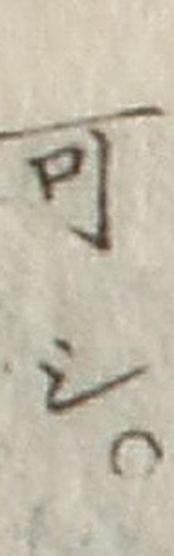可シ。
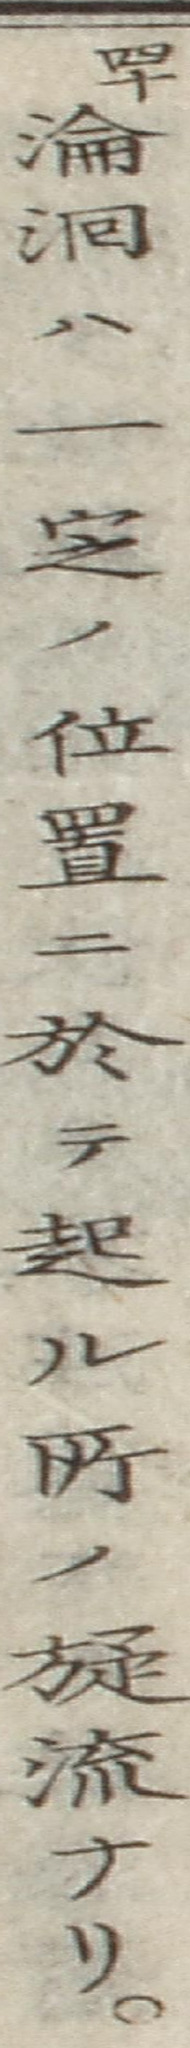四十淪泂ハ一定ノ位置ニ於テ起ル所ノ旋流ナリ。
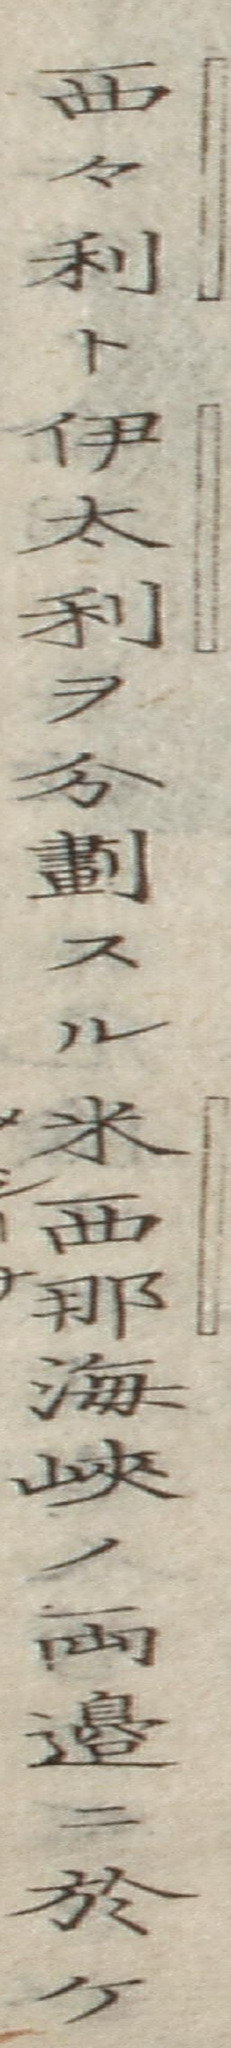西々利ト伊太利ヲ分割スル米西那海峡ノ両辺ニ於ケ

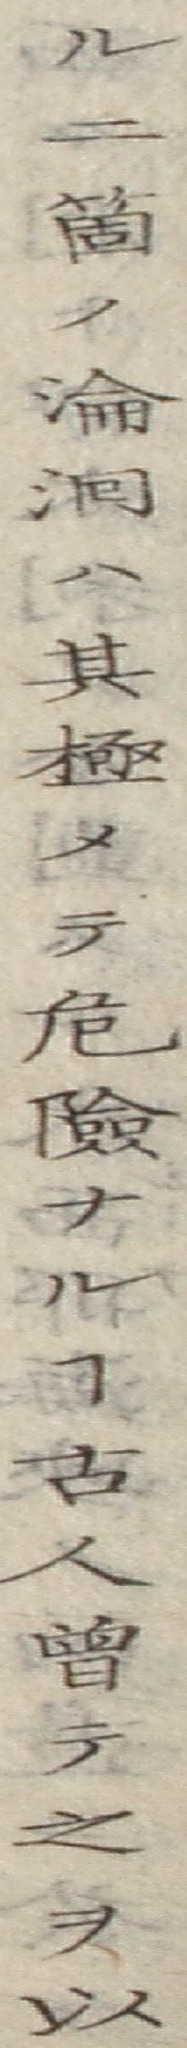ルニ箇ノ淪泂ハ其極メテ危険ナルヿ古人曾テ之ヲ以
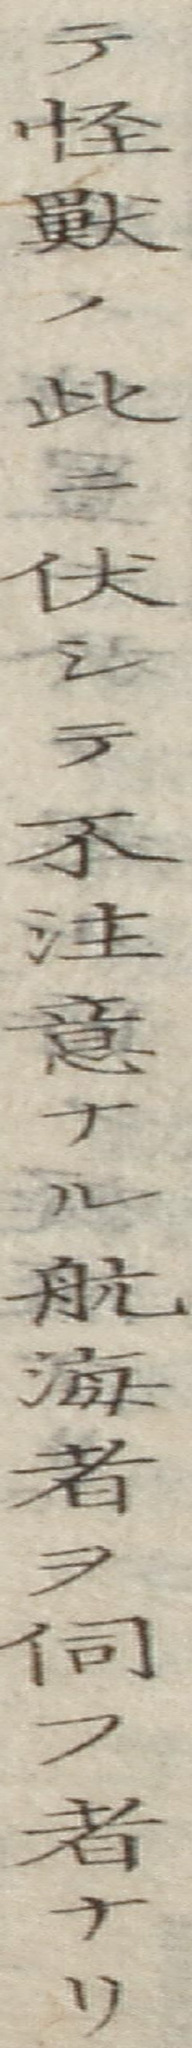テ怪獣ノ此ニ伏シテ不注意ナル航海者ヲ伺フ者ナリ
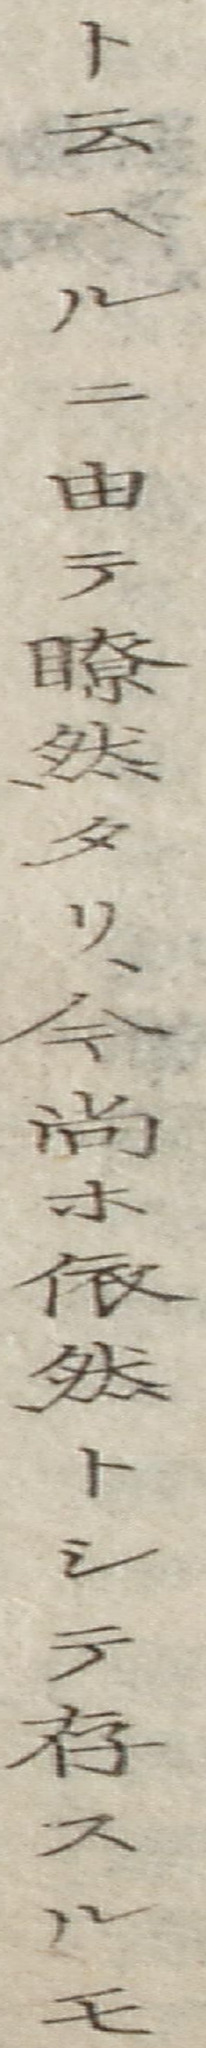ト云ヘルニ由テ瞭然タリ、今尚ホ依然トシテ存スルモ
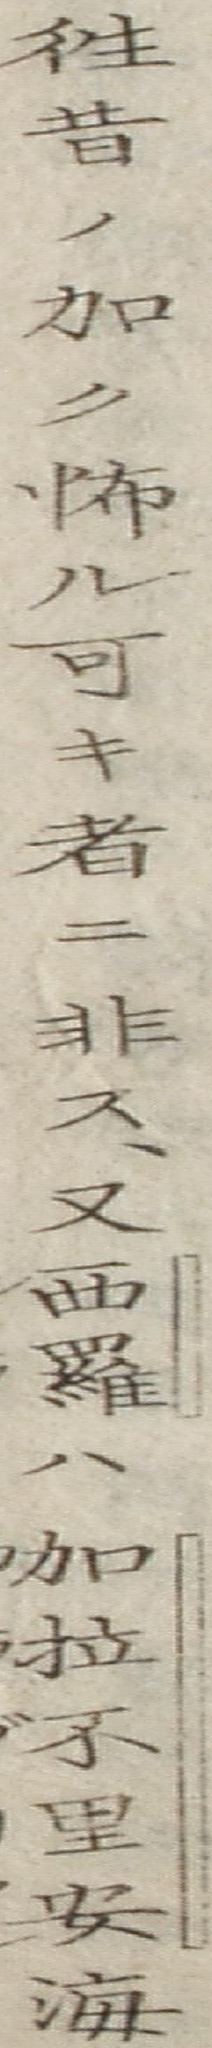往昔ノ加ク怖ル可キ者ニ非ス、又西羅ハ加拉不里安海
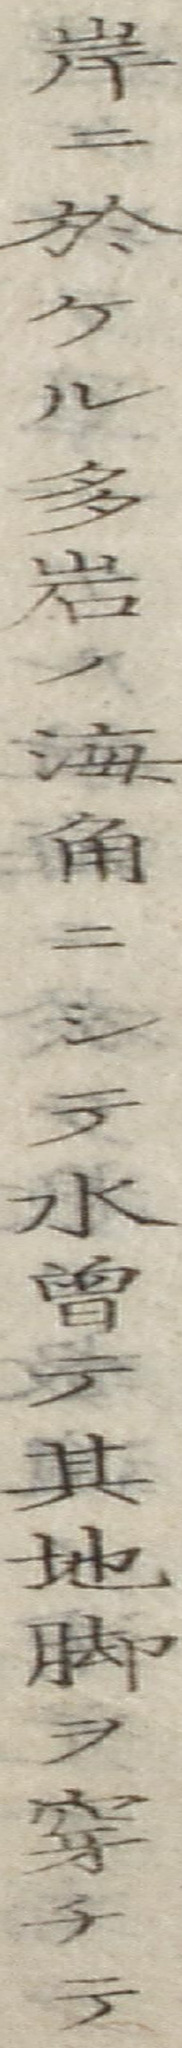岸ニ於ケル多岩ノ海角ニシテ水曾テ其地脚ヲ穿チテ
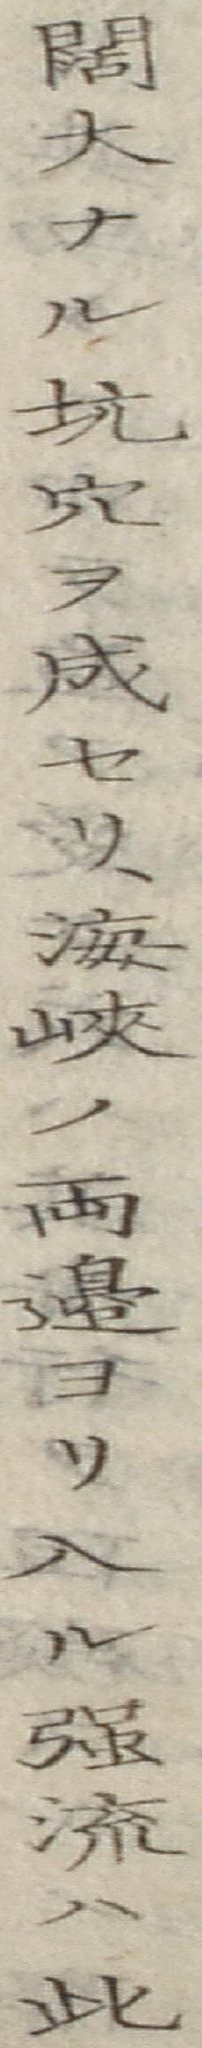闊大ナル坑穴ヲ成セリ、海峡ノ両辺ヨリ入ル強流ハ此
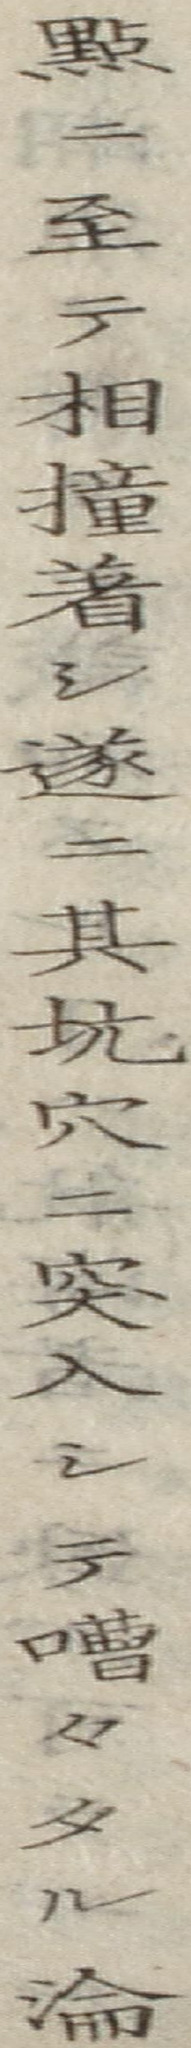点ニ至テ相撞着シ遂ニ其坑穴ニ突入シテ嘈々タル淪
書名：地形論　巻二
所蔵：東京大学地震研究所図書室 Earthquake Research Institute Library, The University of Tokyo, JAPAN
